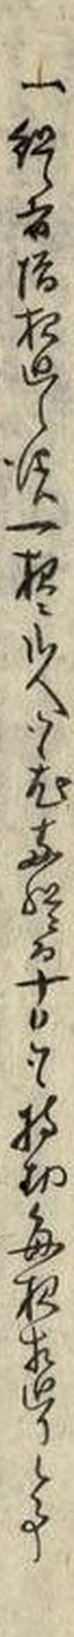一組之者増夜廻之儀は一夜に弐人ツヽ尤両組にて十日ツヽ持切毎夜相廻り候事
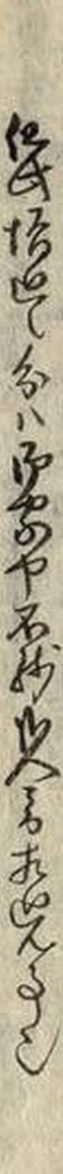但此増廻之分は御家中不残弐人にて相廻ル事也
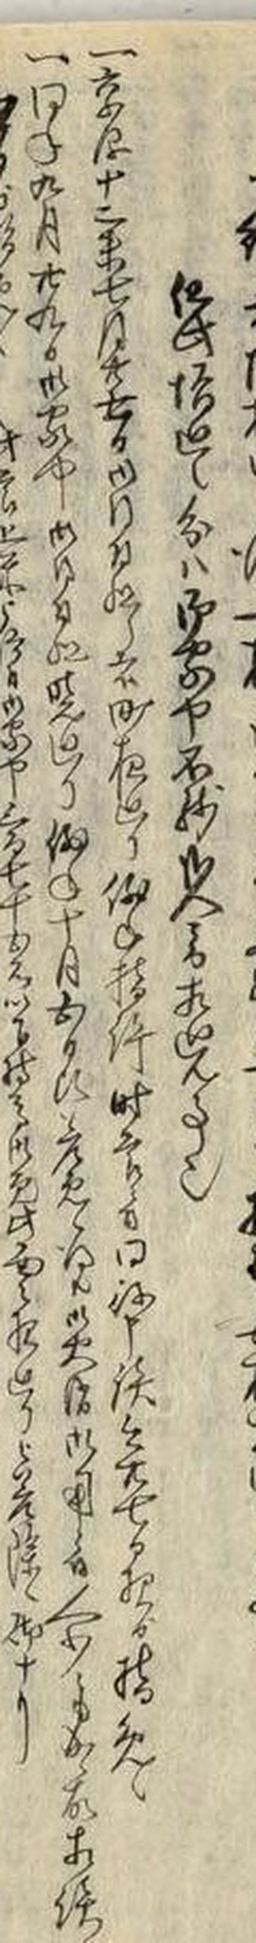一享保十二未七月廿七日御目付組之者町夜廻り例年指許時節に付同役申談今廿七日夜ゟ指免候
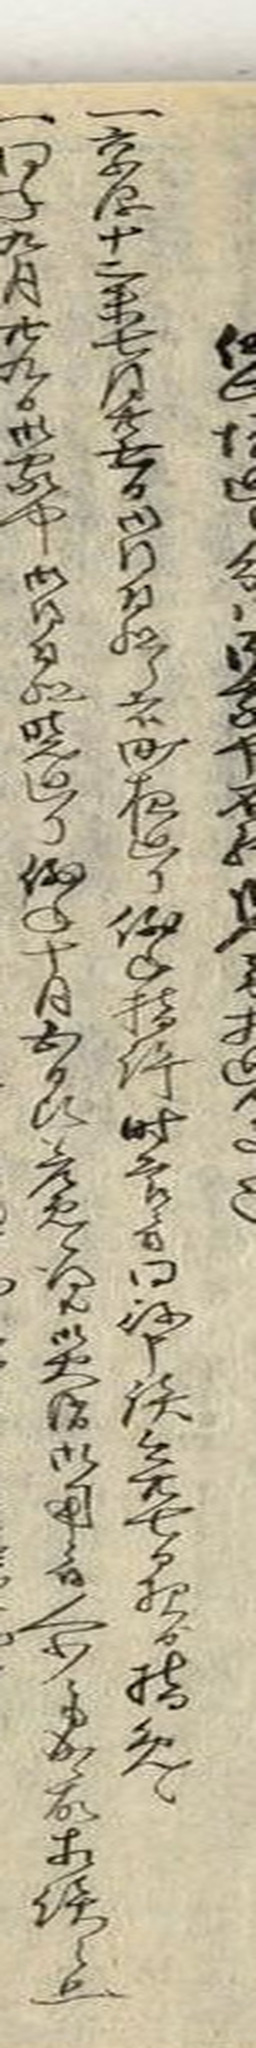一同年九月廿九日御家中御目付組暁廻り例年十月五日頃差免候得共御火消御用に付人少にも成候故相談之上
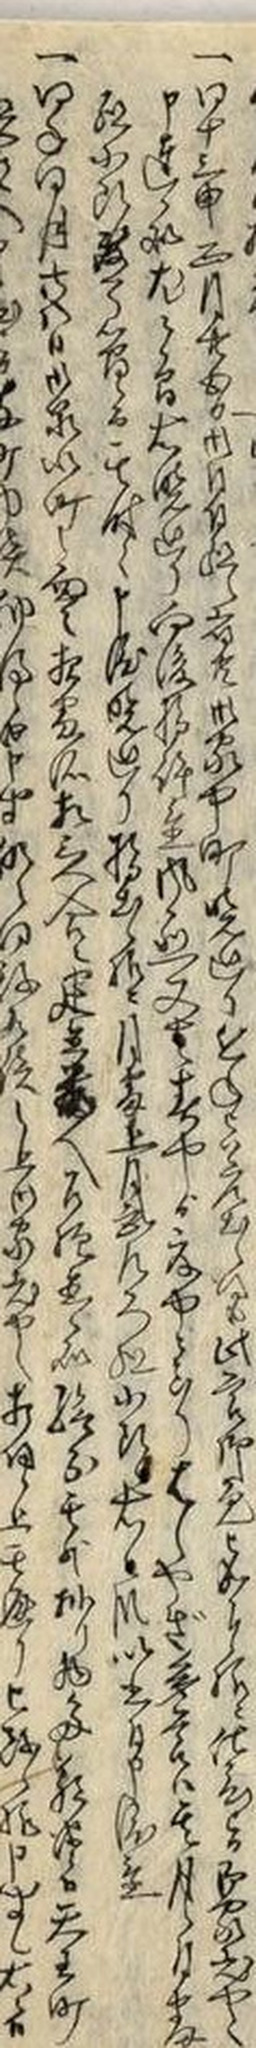組小頭了簡にて其時々申渡暁廻り指出候様に月番上月武左衛門組小頭右之段以書付申渡置
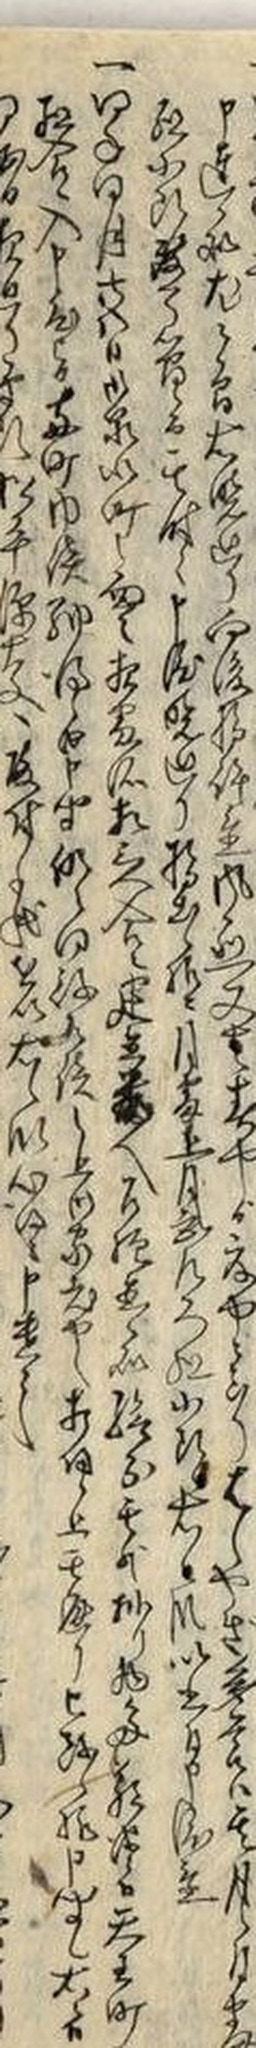一同年同月廿八日御泉水町之面々夜番所拾三人合シ建置番人召抱置候処給分其外掛り物多難儀に付天王町
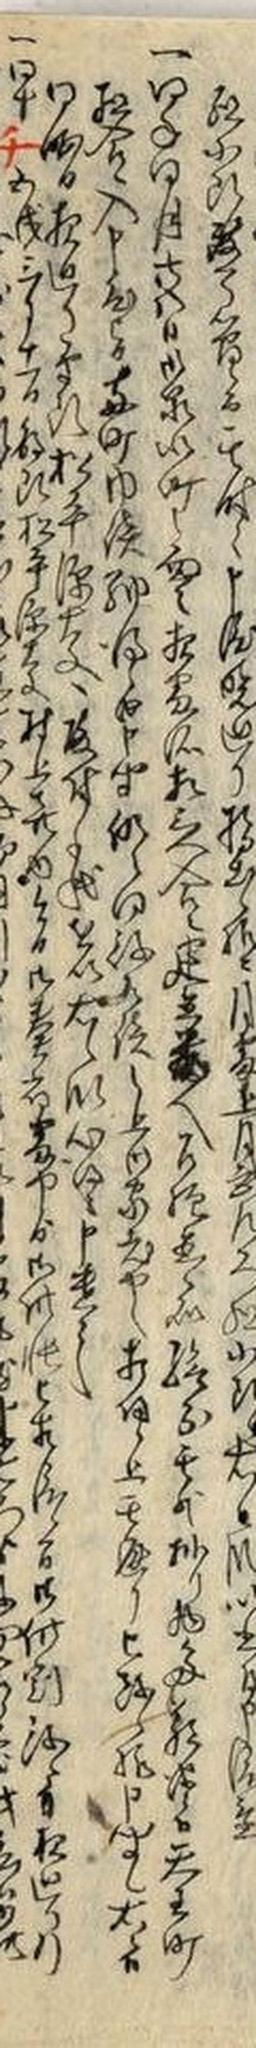組合へ入申度旨両町内談納得候由申聞仍之同役相談之上御家老中へ相伺候上其通り被致候様申聞候右に付
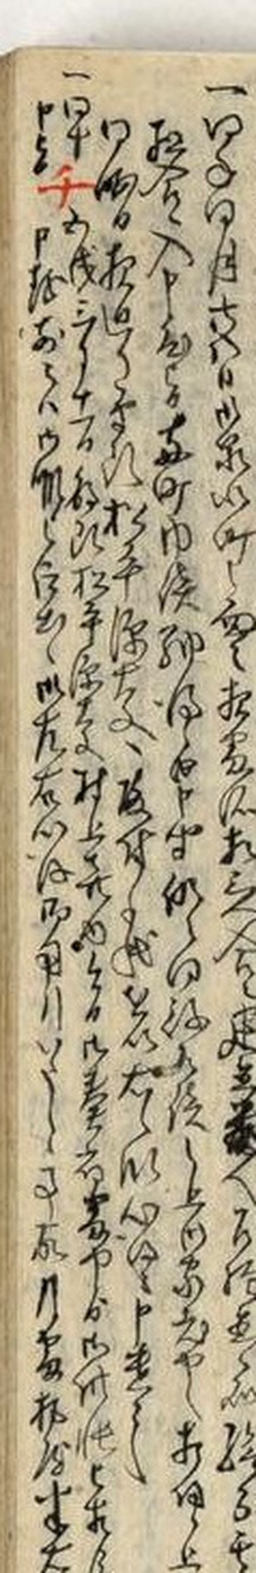同晦日夜廻り筆頭松平源大夫へ殿付手紙を以右之段心得に申遣之
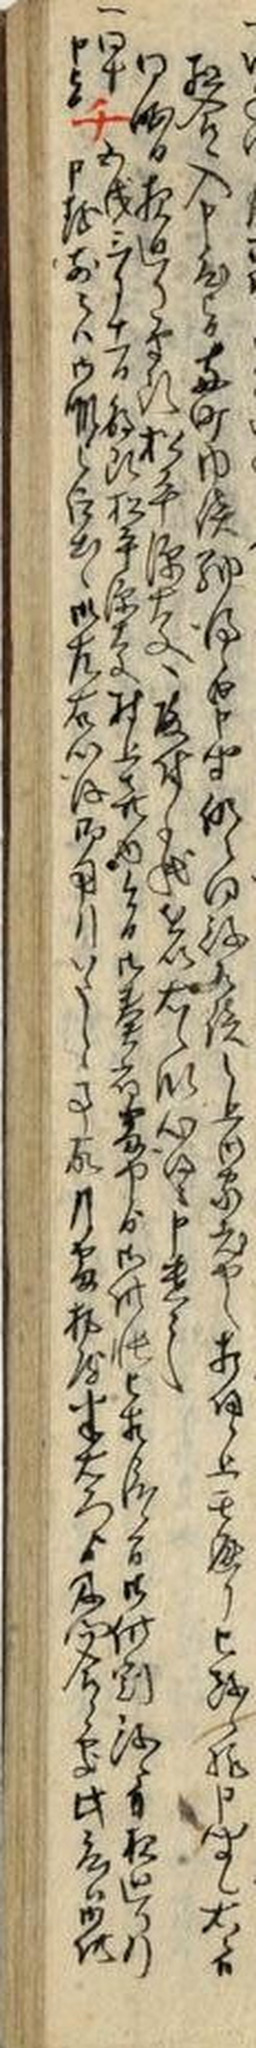一同十五戌三月十一日触頭松平源大夫村上喜内今日御奏者番中ゟ御供帳被相渡候間御供割致候に付夜廻り引
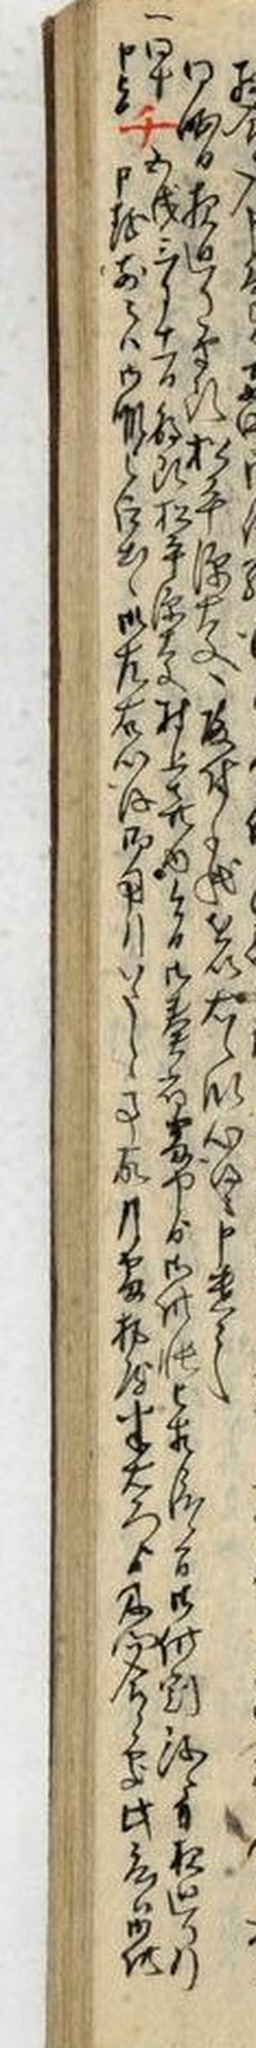申旨申越前々は御順被仰出候御左右以後御用引いたし候事故月番栃屋半右衛門ゟ及問合候処此度は御供

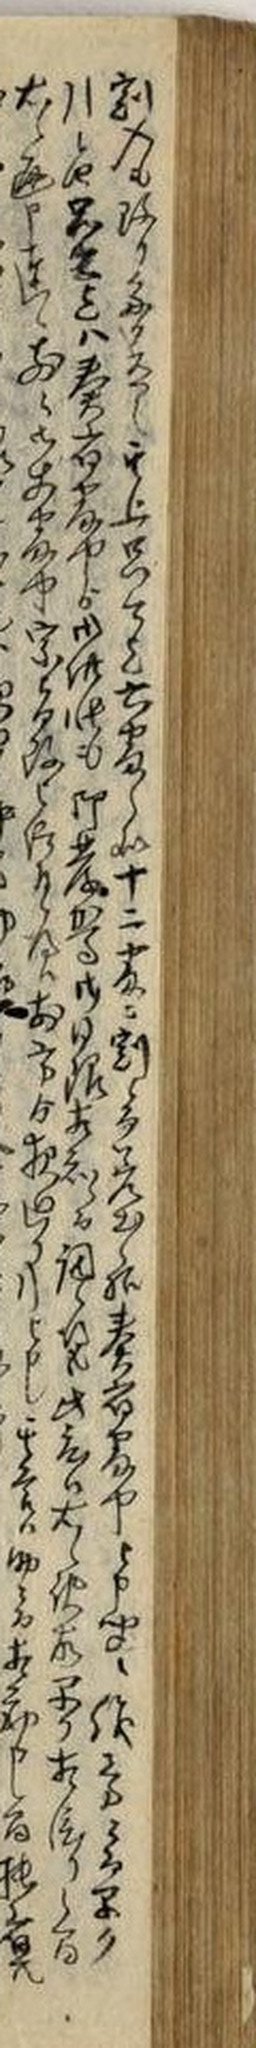割入も改り多ク有之其上只今迄六番之処十二番に割候て差出候様奏者番中被申聞候儀旁にて早ク
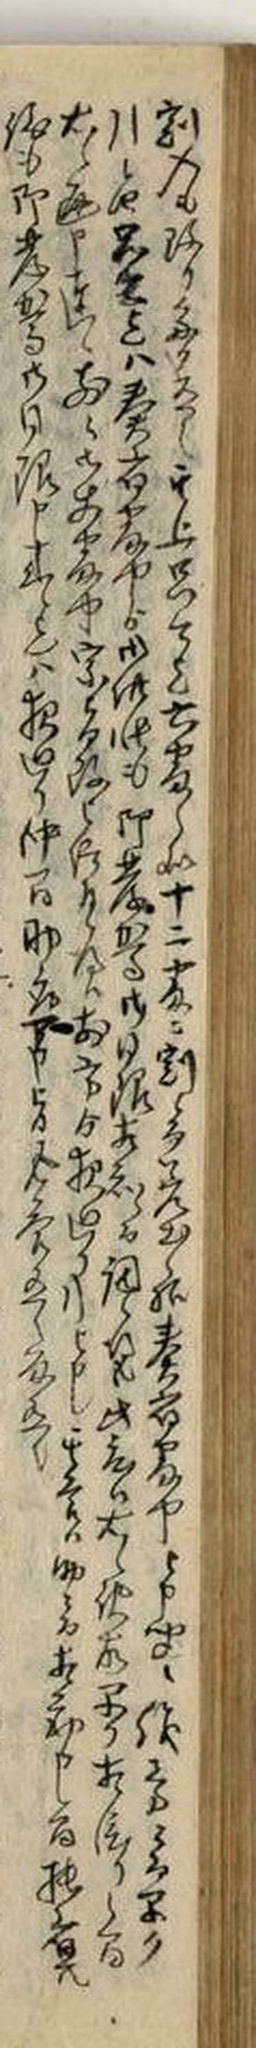引候由只今迄は奏者番中ゟ御供帳も御発駕御日限相知候て調候得共此度は右之訳故早ク相渡り候間
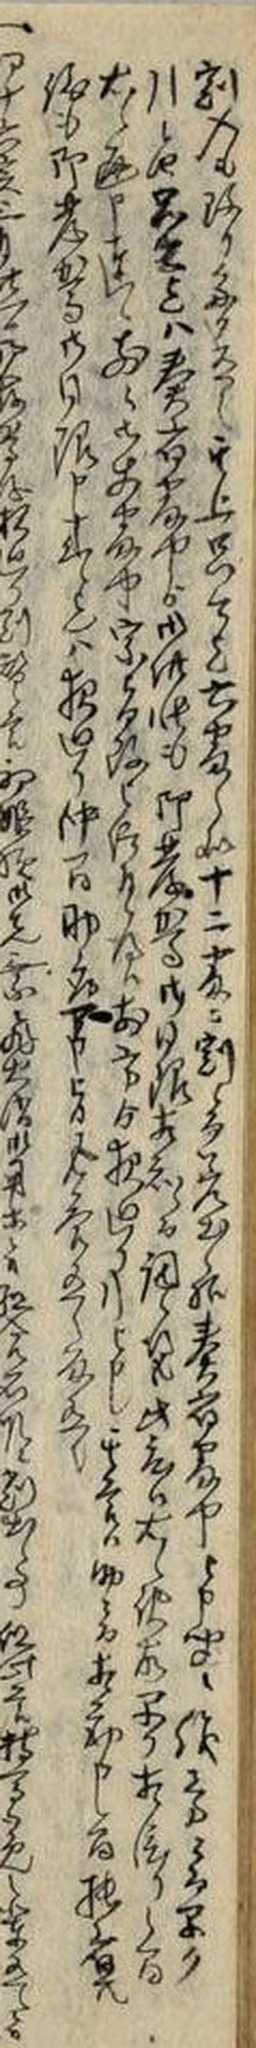右之通申達候前々御使番中宗旨改被仰付候得は前方ゟ夜廻り引被申候其節は助にて相勤申候間拙者共
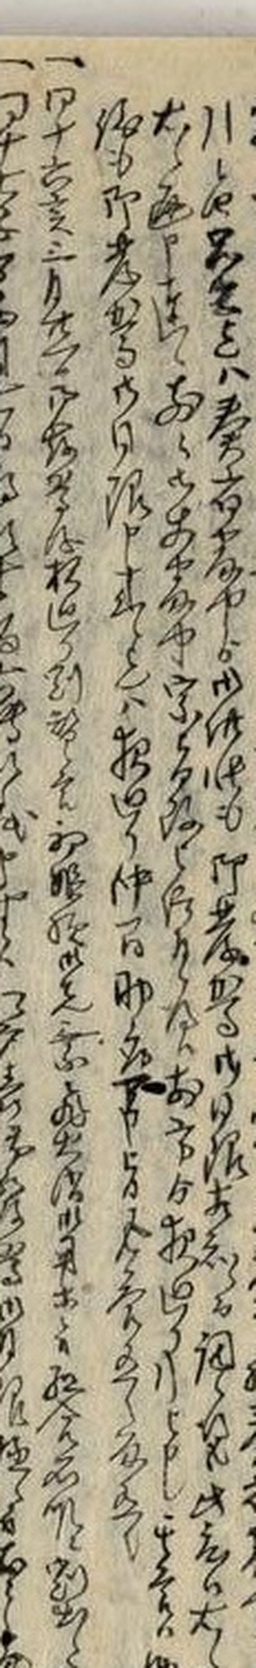儀も御発駕御日限申来候迄は夜廻り仲間助取可申旨返答有之留有之
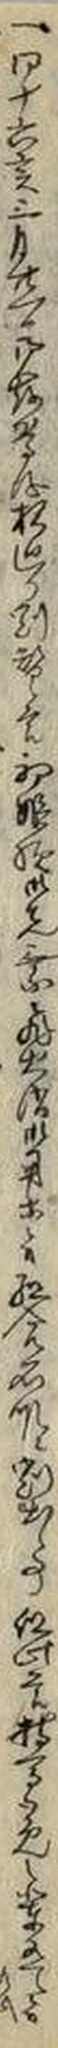一同十六亥三月廿一日御発駕後夜廻り割替之節初姫様御先乗飛火消御用等に付組合不順に割出候事但此節持馬御免之輩有之に付如此
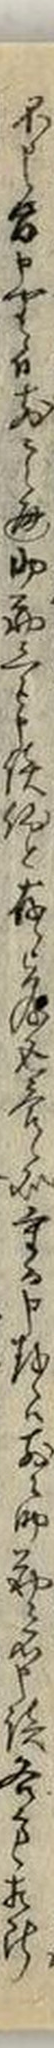不申候旨申聞候に付前々之通助勤に可被申談儀と存候旨及返答候処重て申越候は前々助勤に不申談各方へ相断
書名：御城下諸事之部
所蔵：福井県文書館 Fukui Prefectural Archives
